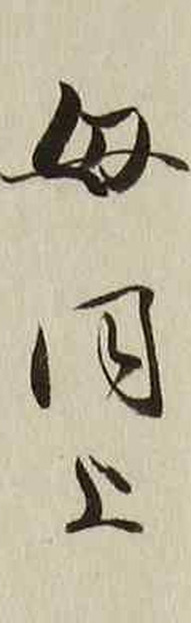母同上
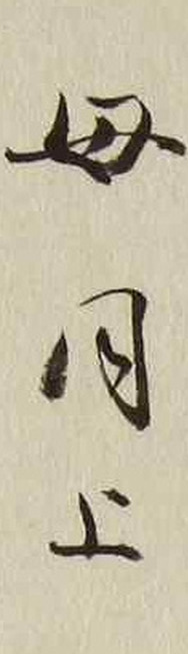母同上
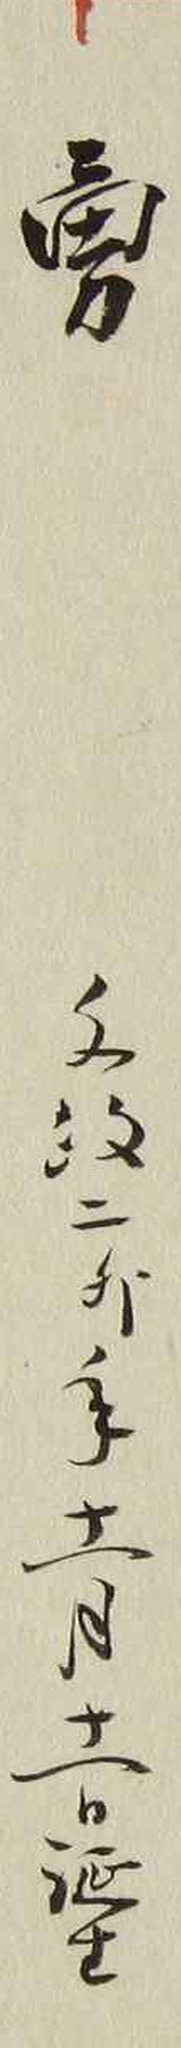勇文政二卯年十一月十一日誕生
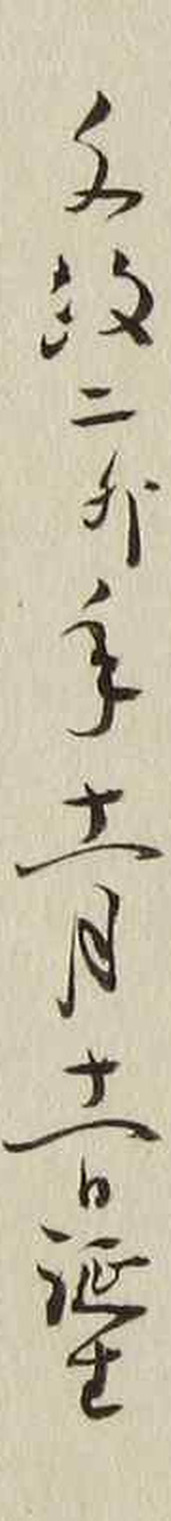勇文政二卯年十一月十一日誕生
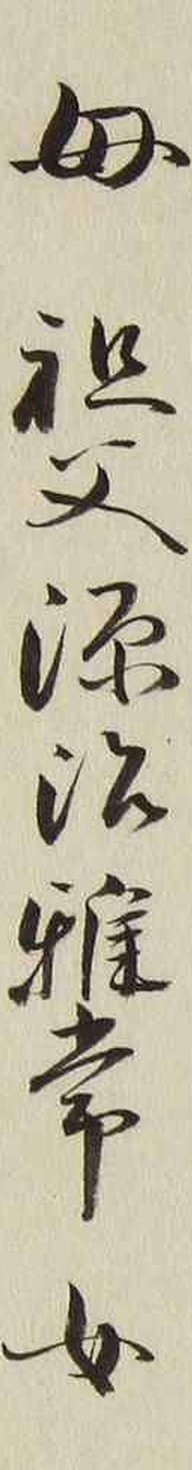母祖父源治雅常女

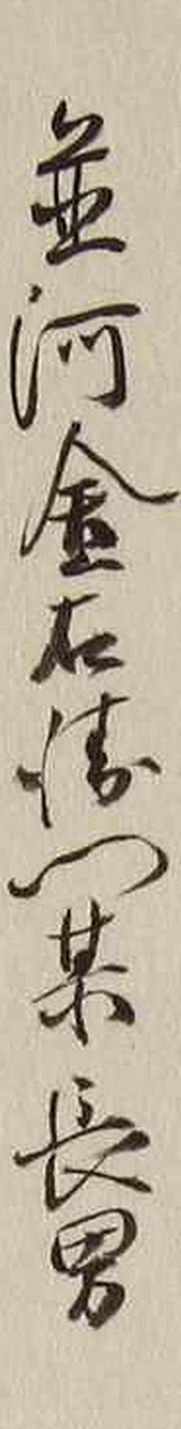並河金右衛門某長男
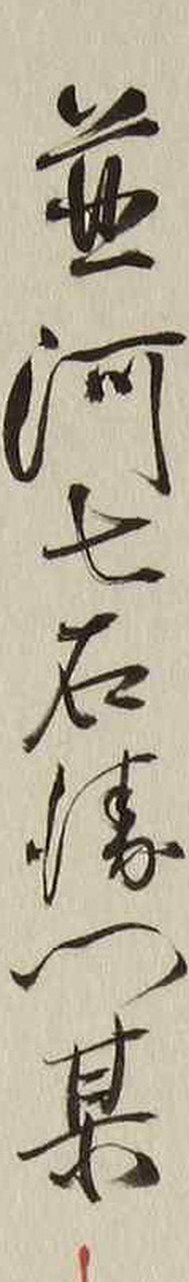並河七右衛門某
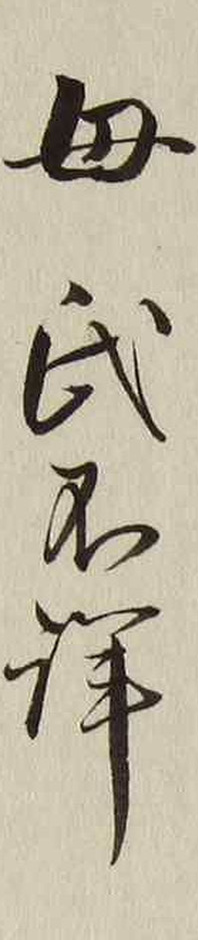母氏不詳
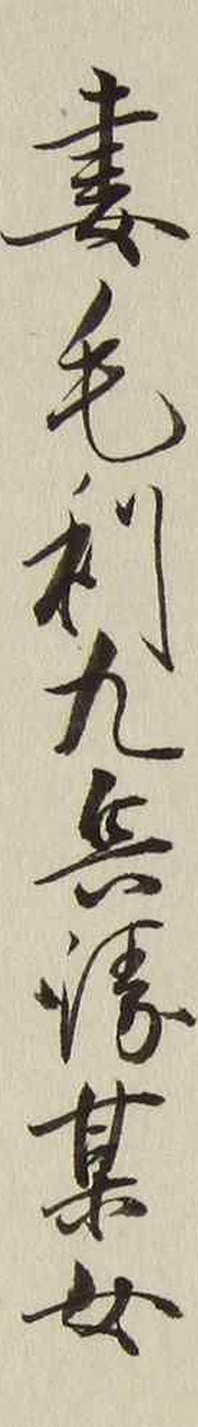妻毛利九兵衛某女
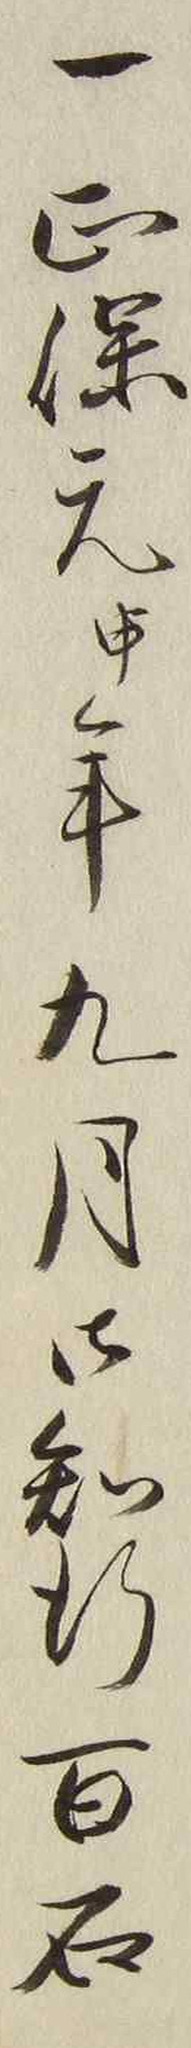一正保元申年九月御知行百石

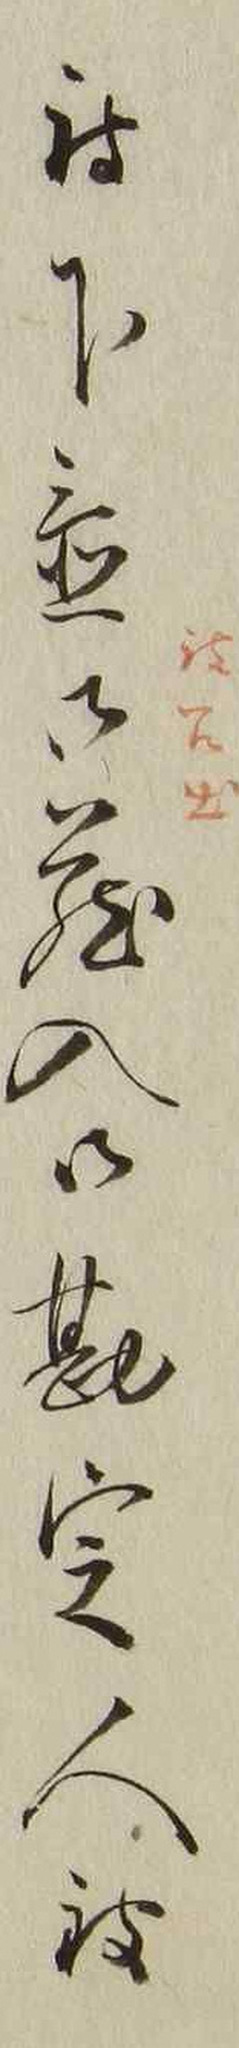被下置御蔵入御勘定人被
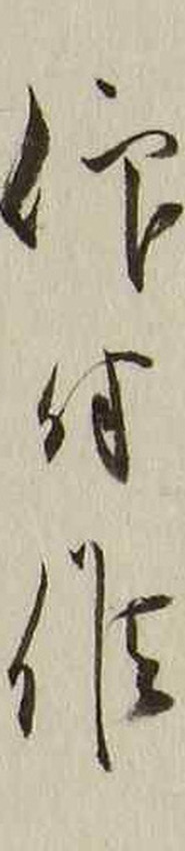仰付候
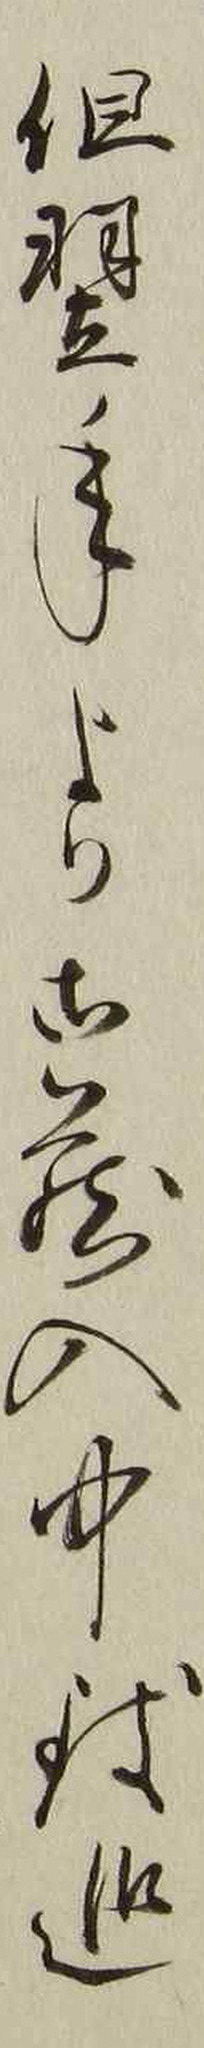但翌年より御蔵入中致巡
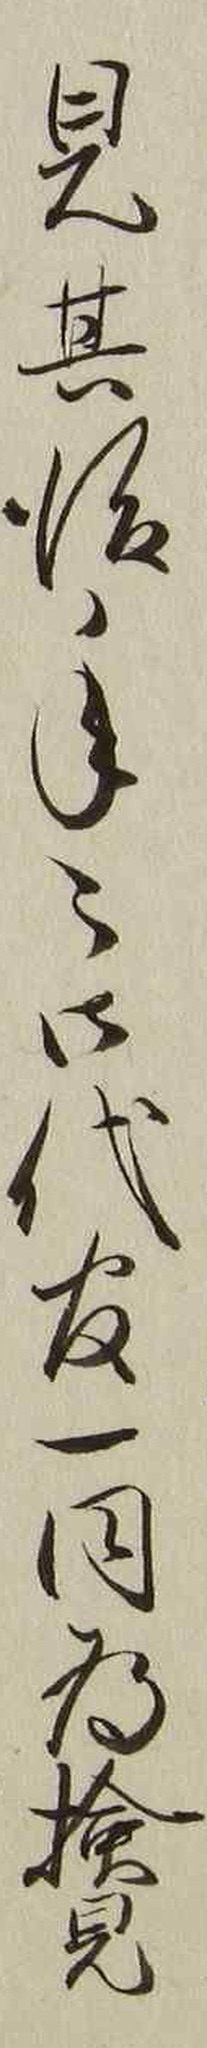見其後年々御代官一同為検見
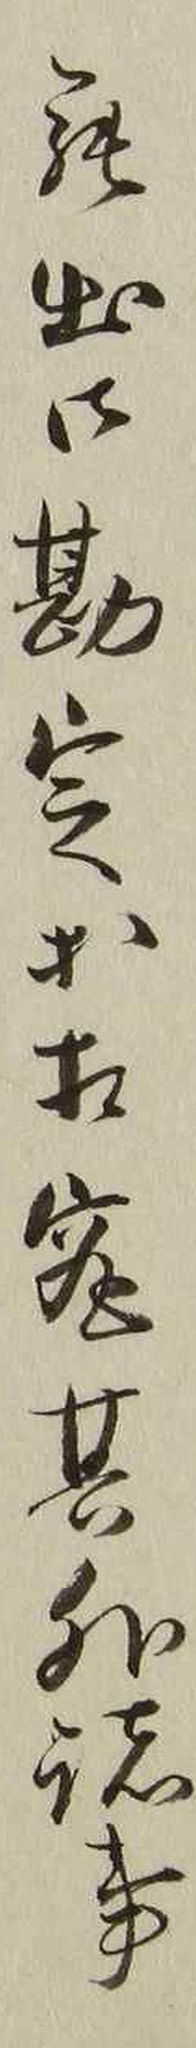罷出御勘定等相究其外諸事
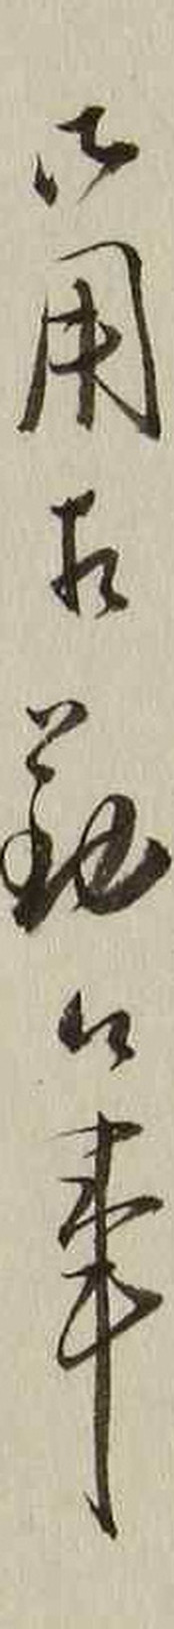御用相勤候事
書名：諸士系譜　巻之163　な之部5
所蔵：会津若松市立会津図書館
